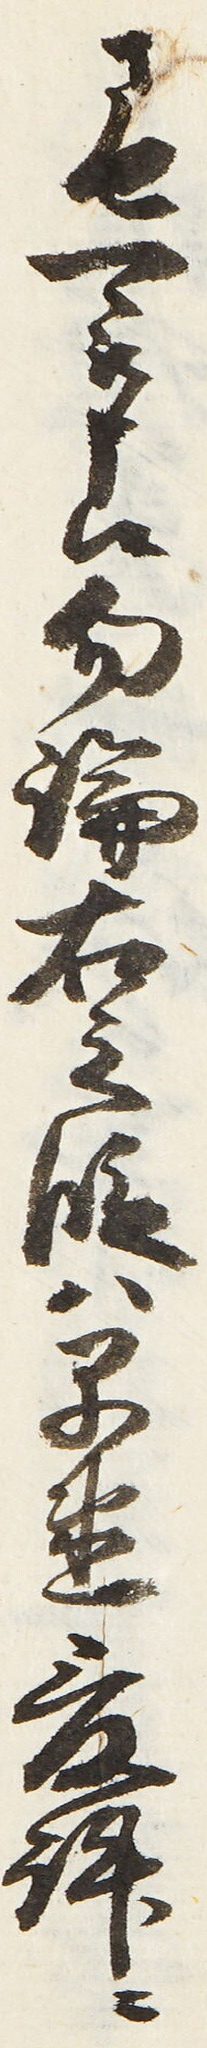候由可被申候勿論右之段ハ早速爰許ニ
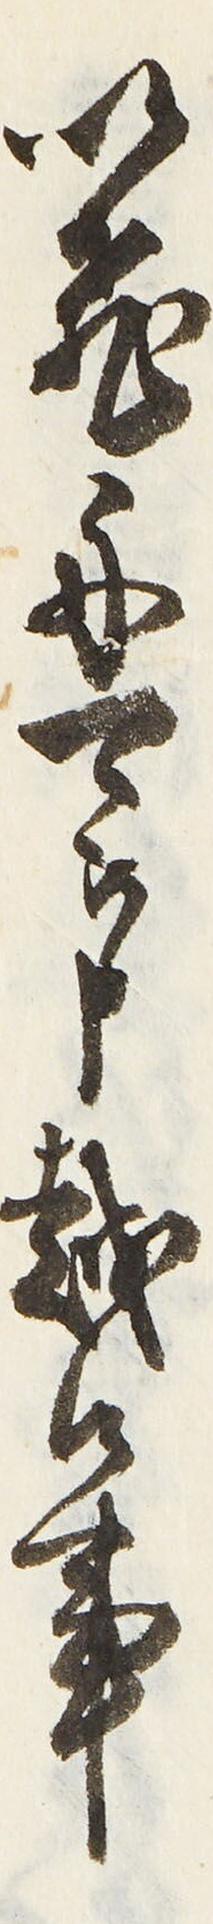以飛舟可被申越候事
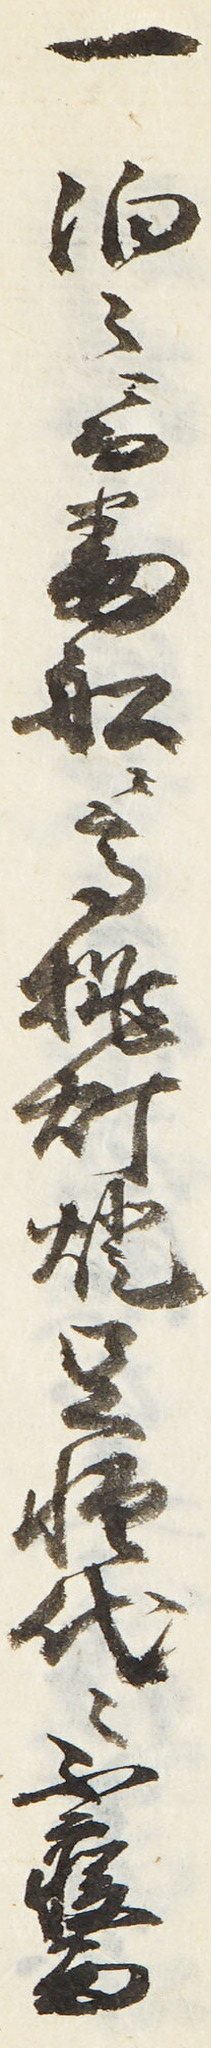一泊々ニ而番船ニ高挑灯燈足軽代々不寝番
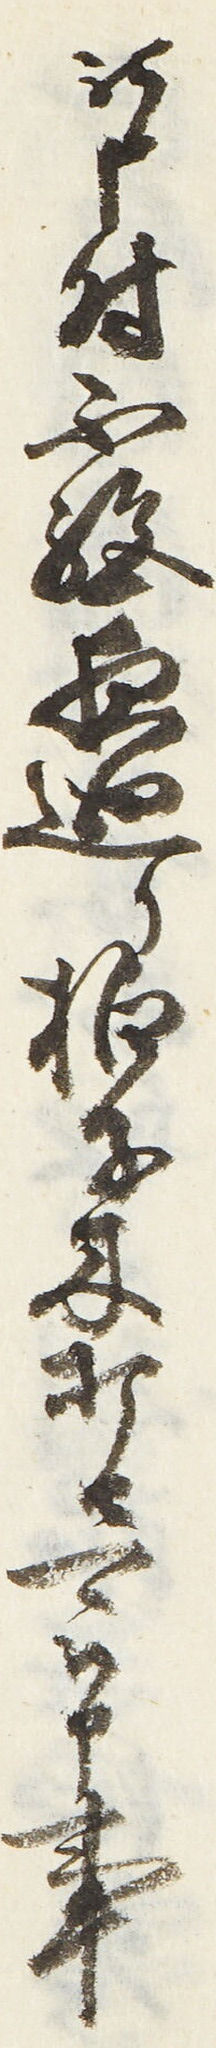被申付不絶夜廻り拍子木打可被申事
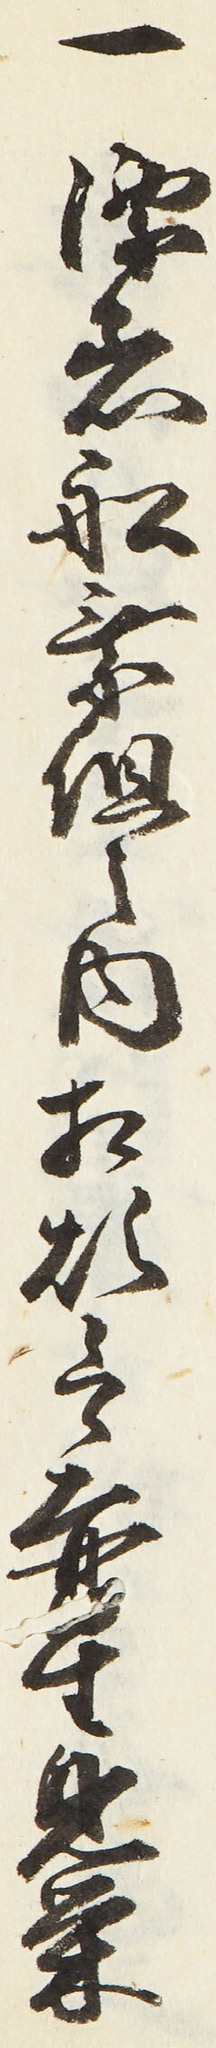一漂着船乗組之内相煩候ハヽ赤星見栄

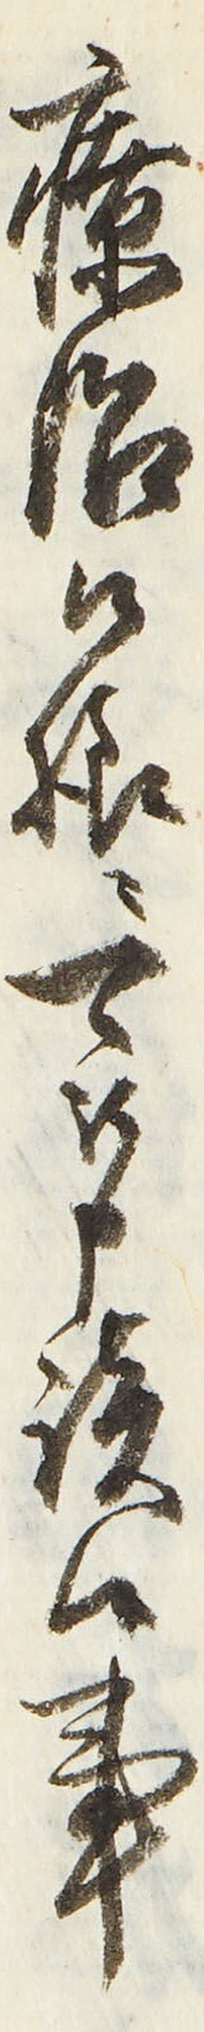療治候様ニ可被申談候事
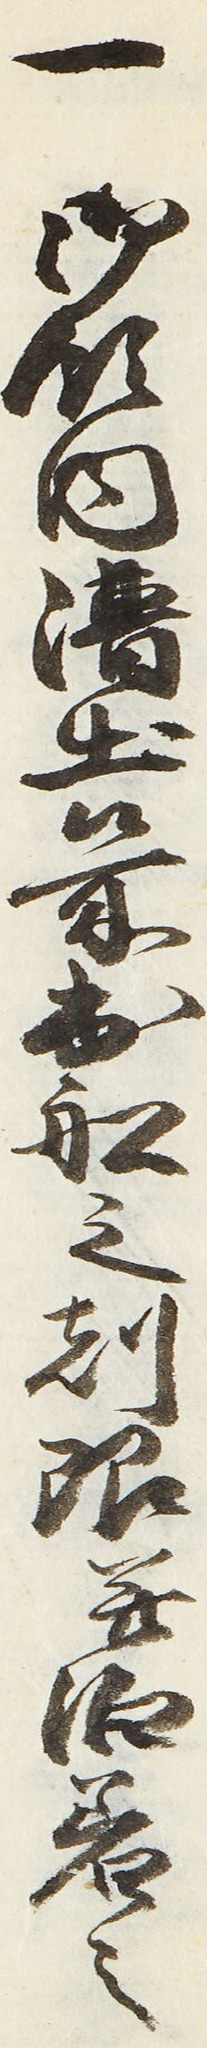一御領内漕出候所出船之刻限并泊着之
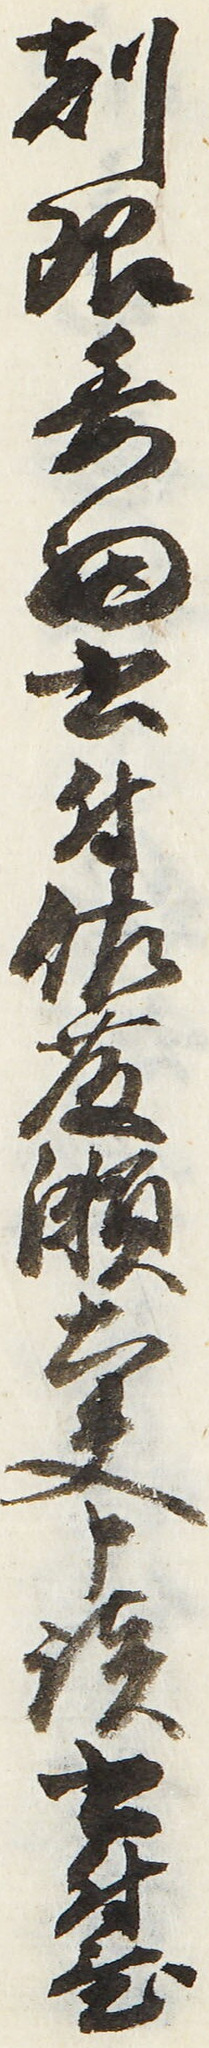刻限委細書付佐藤瀬大夫申談書付置
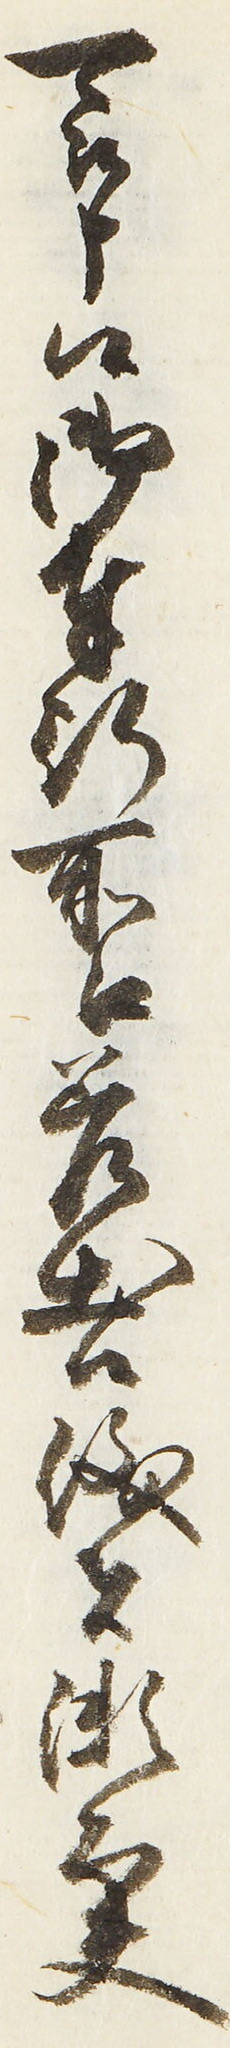可被申候御奉行所江差出候儀者瀬大夫
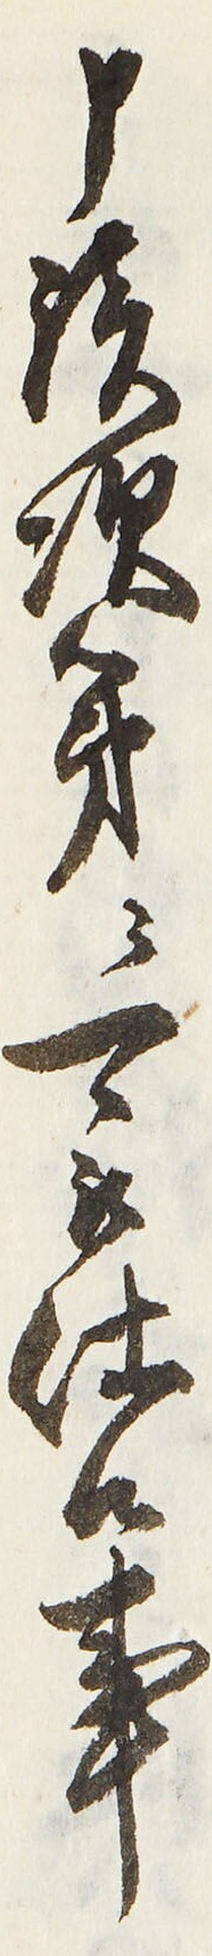申談次第ニ可被仕候事
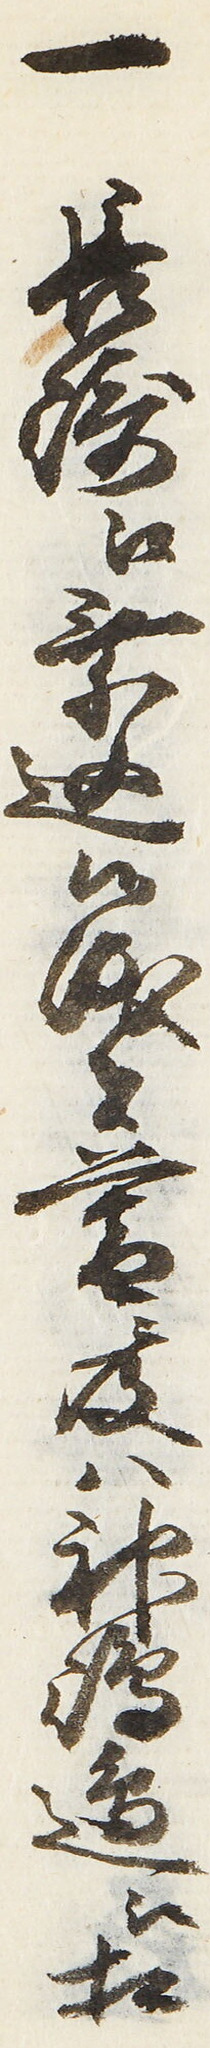一長崎江乗込候儀者暮ニ及ハ神島辺江相
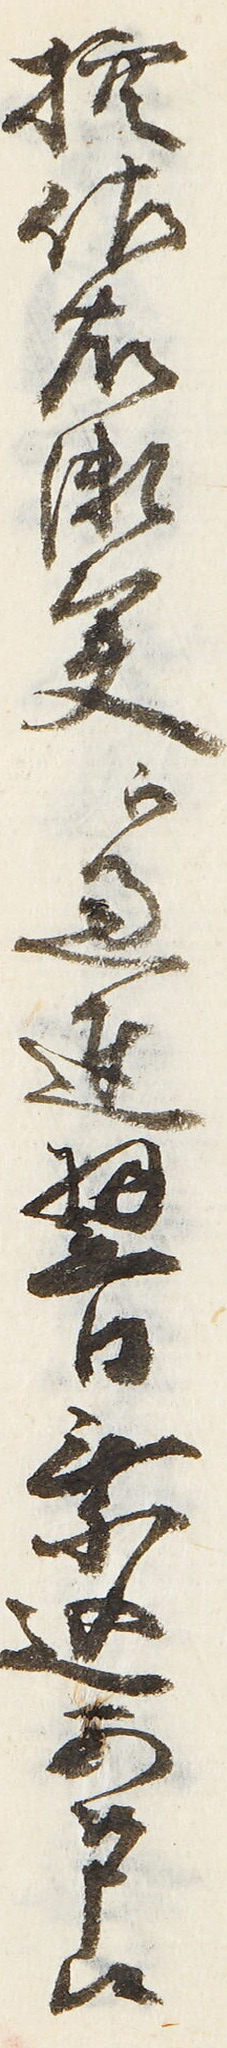控佐藤瀬大夫江通達翌日乗込可被申候
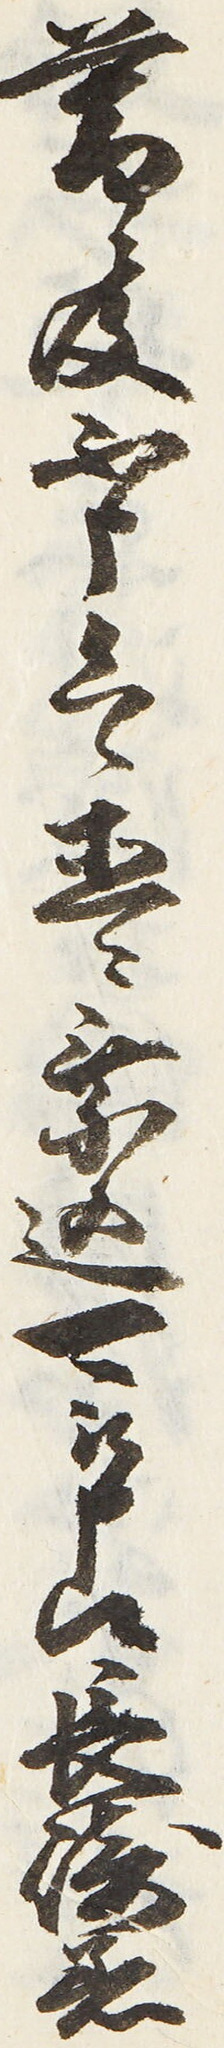暮ニ及不申候ハヽ直ニ乗込可被申候長崎着
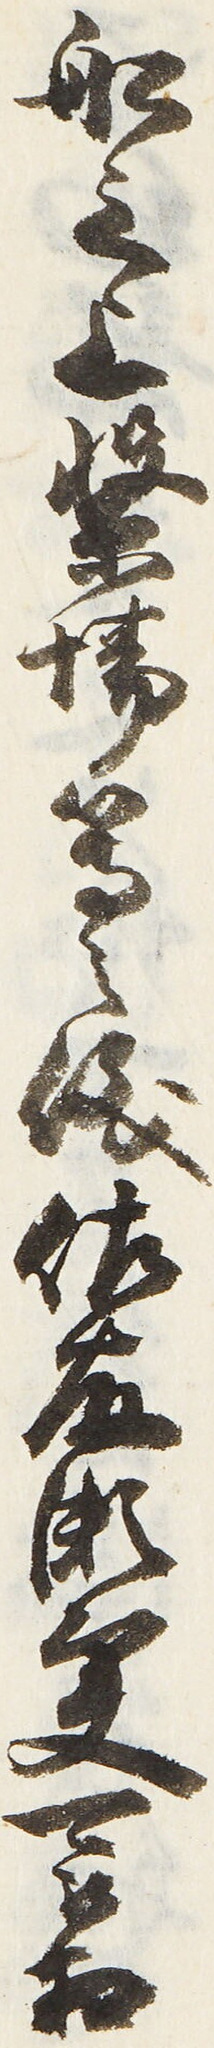船之上繋場等之儀佐藤瀬大夫可被相
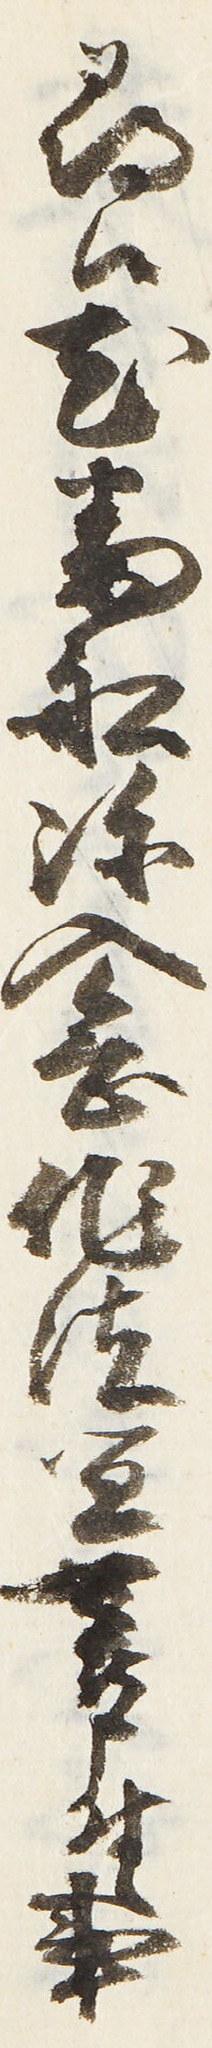尋候尤番船弥入念作法宜可被申付候事
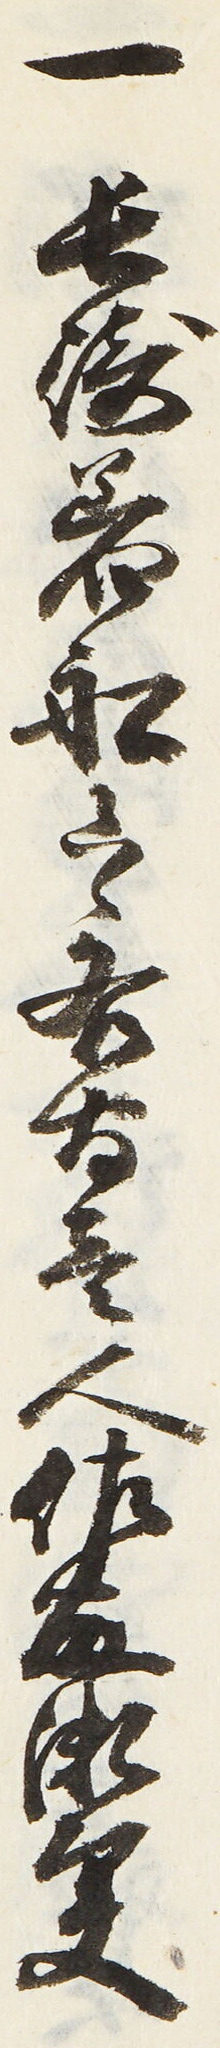一長崎着船候ハヽ各壱人佐藤瀬大夫
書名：玄海嶋江漂着船為警固長崎江被越候覚
